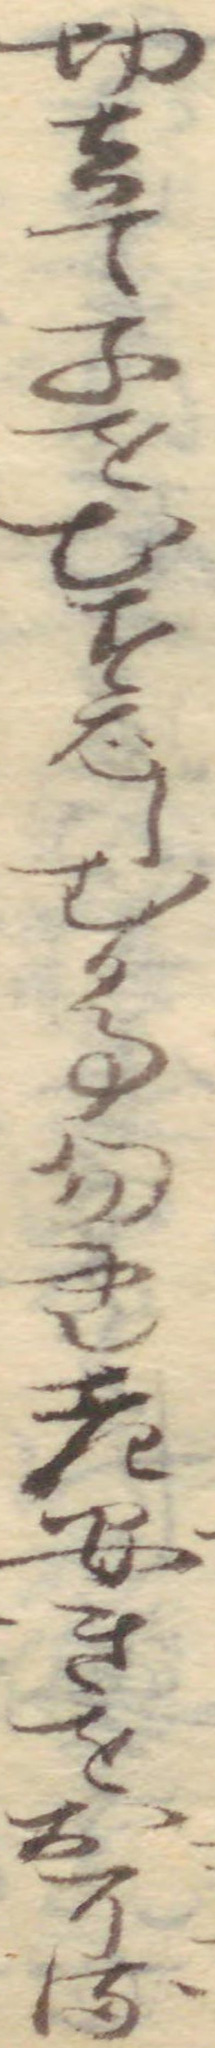切去て子をむすばしむる事勿れ老安きをおそる
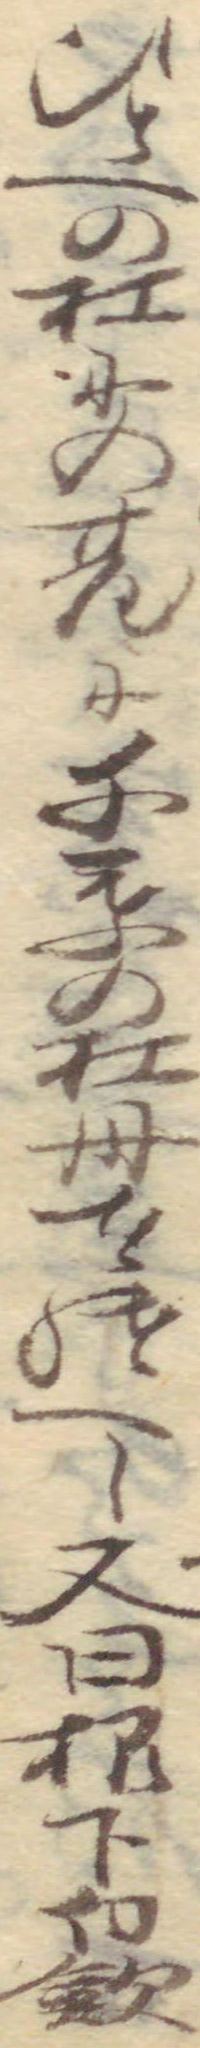ひとへの牡丹の臺に千葉の牡丹を継へし又曰根下白斂
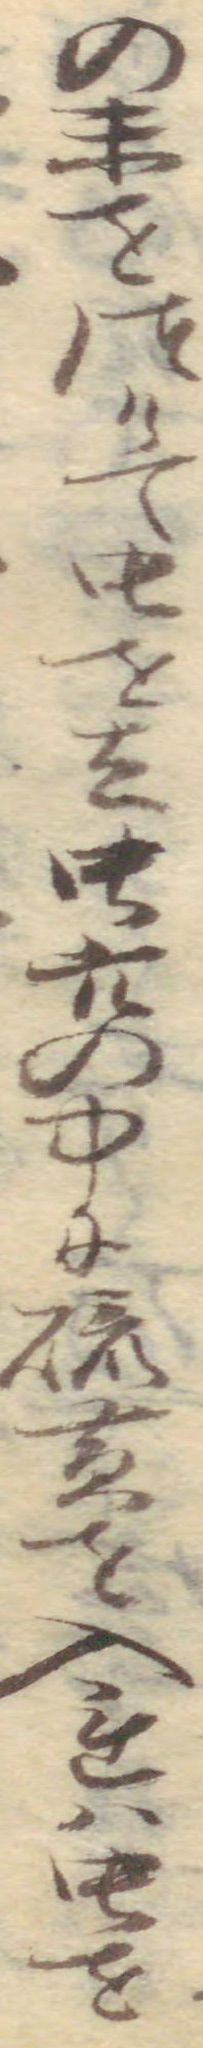の末をつけて虫を去虫穴の中に硫黄を入れハ虫を
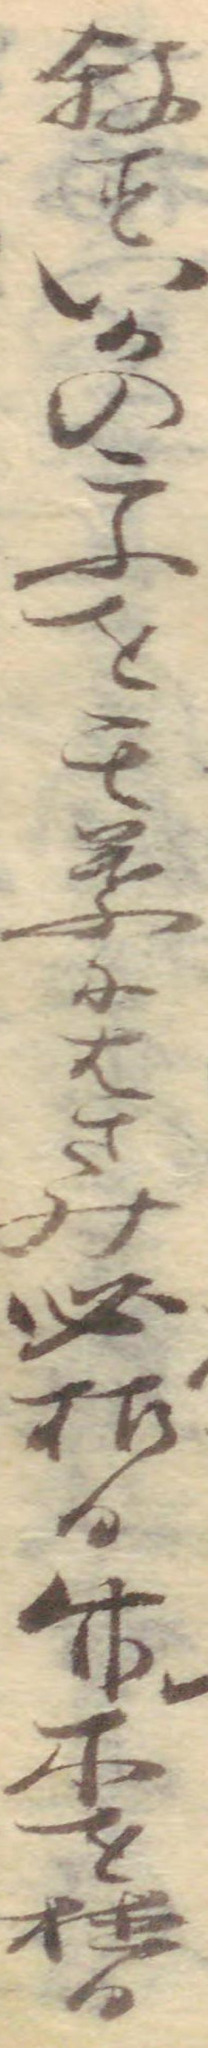殺すいかのこふを其葉にはさみ必枯る竹木を植る
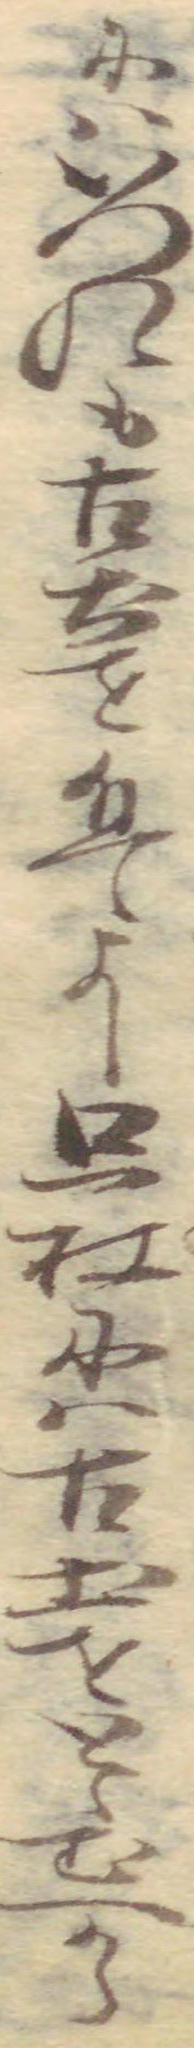にハいつれも古土を付てよし只牡丹ハ古土をとゝむへから
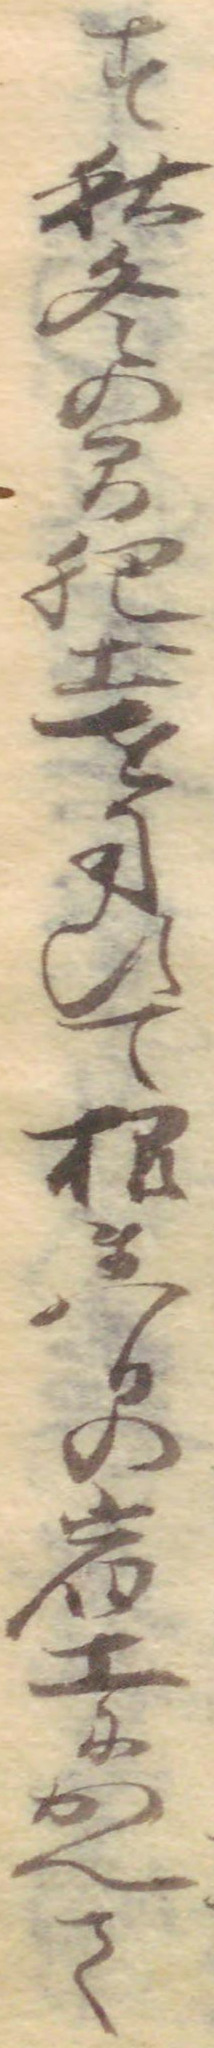す秋冬の間肥土を用ひて根のまハりの宿土にかへて

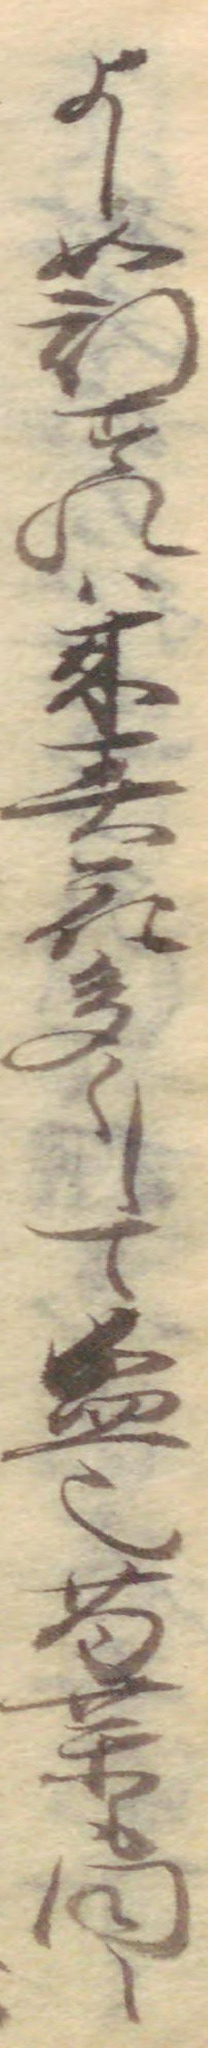よし如斯すれハ来春花多くして盛也芍薬も同し
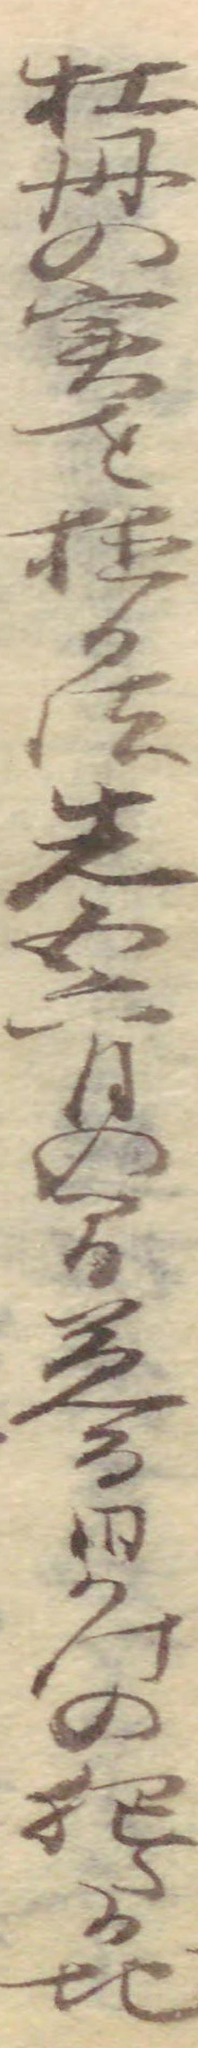一牡丹の実を植る法先五六月の間兼て日かけの肥たる地
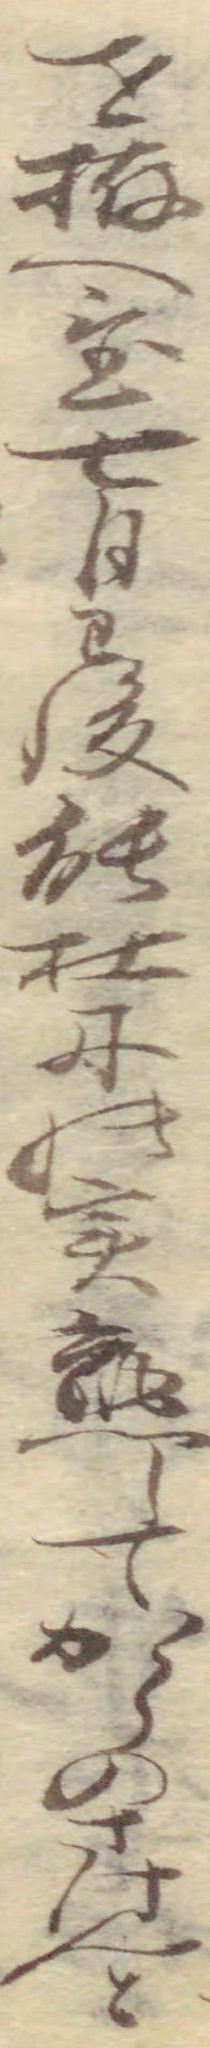を拵へ置七月已後能牡丹の実熟してからのさけんと
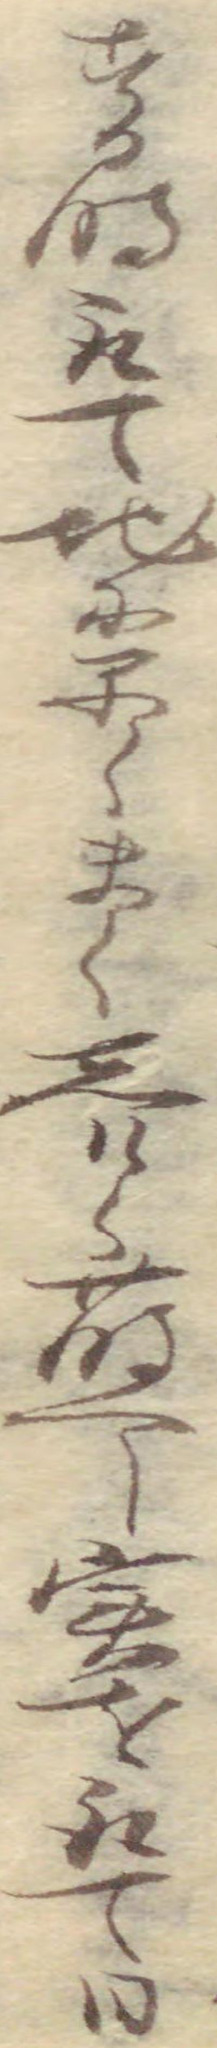する時取て地に早くまくしけく蒔へし実を取て日
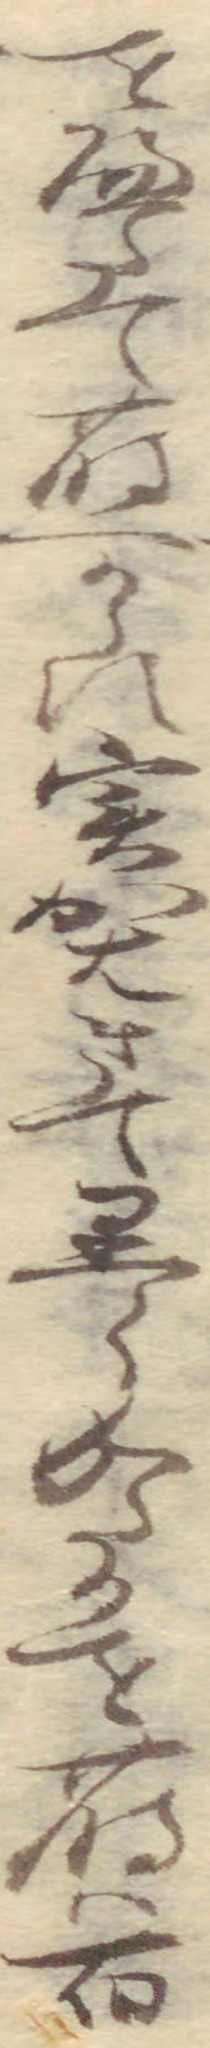をへたて蒔へからす実かはきて黒く成たるを蒔ハ百
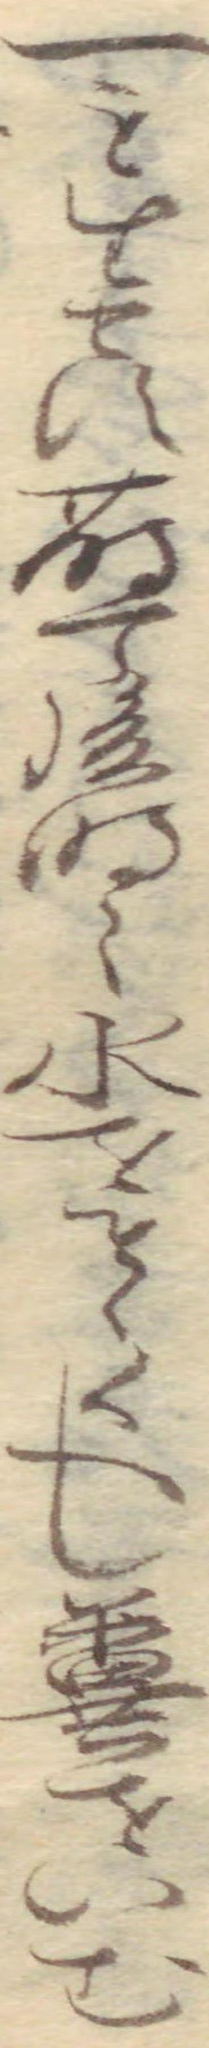一も生せす蒔て後時々水をそゝくへし糞をいむ
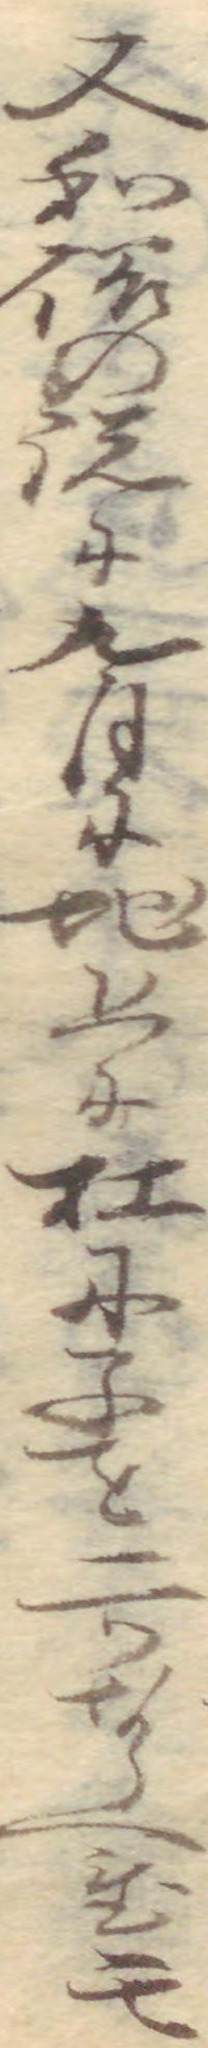又和俗の説に九月に地上に牡丹子を二つならへ置其
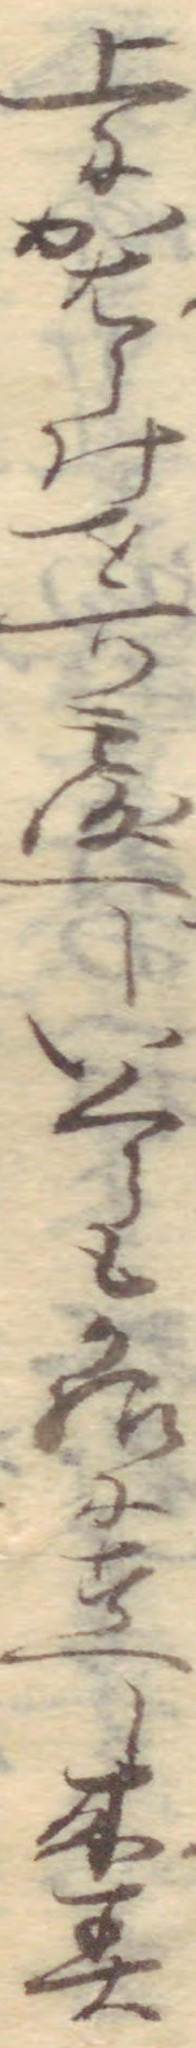上にかはらけを一つ覆へしいくらもか様にすへし来春
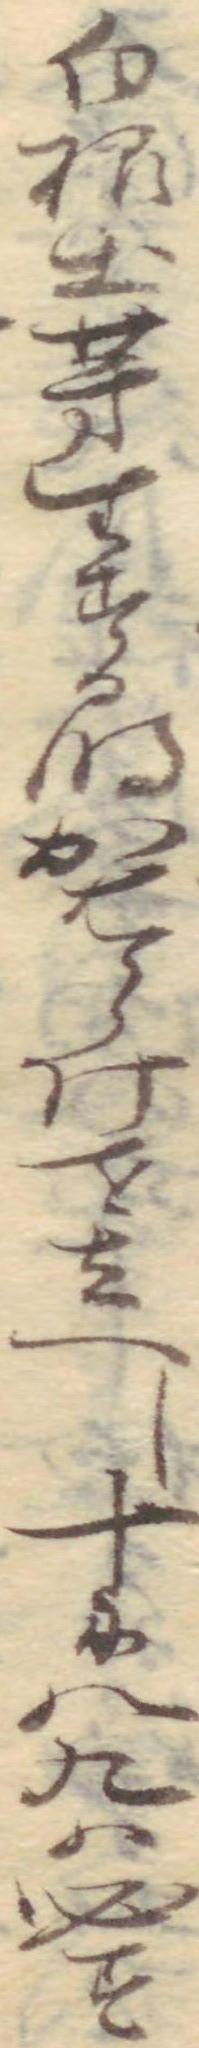白根出芽生する時かはらけを去へし十に八九ハ必す
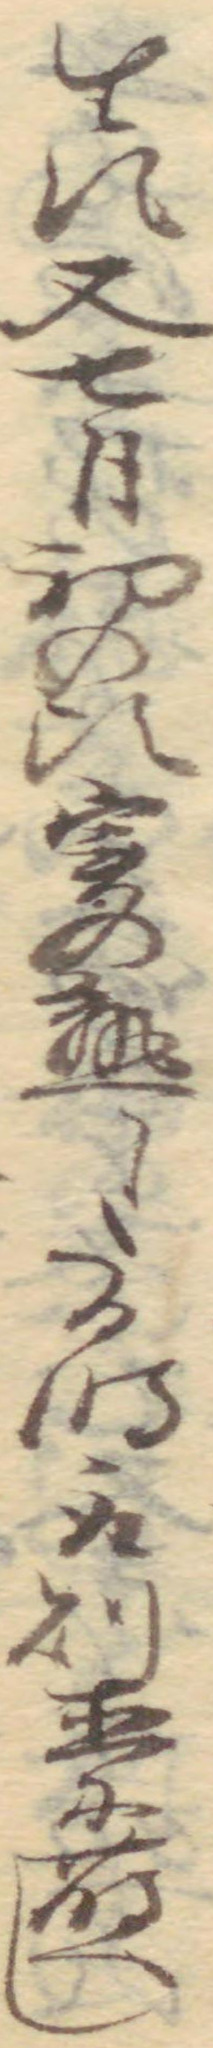生す又七月初の頃実の熟したる時取即直に蒔へし
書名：鶯宿雑記. 巻199-200
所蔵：国立国会図書館 National Diet Library, JAPAN
